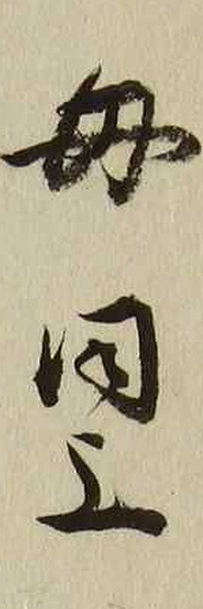母同上
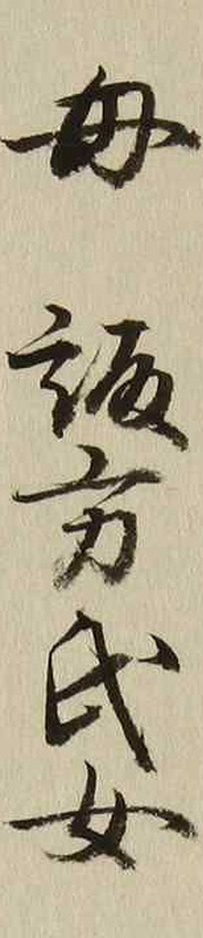母諏方氏女
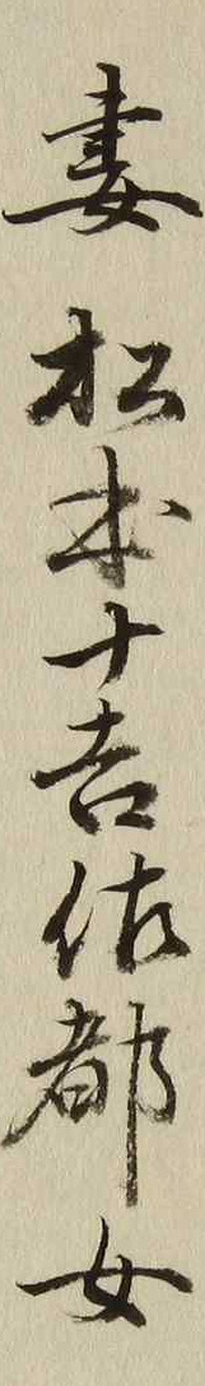妻松本十吉佐都女
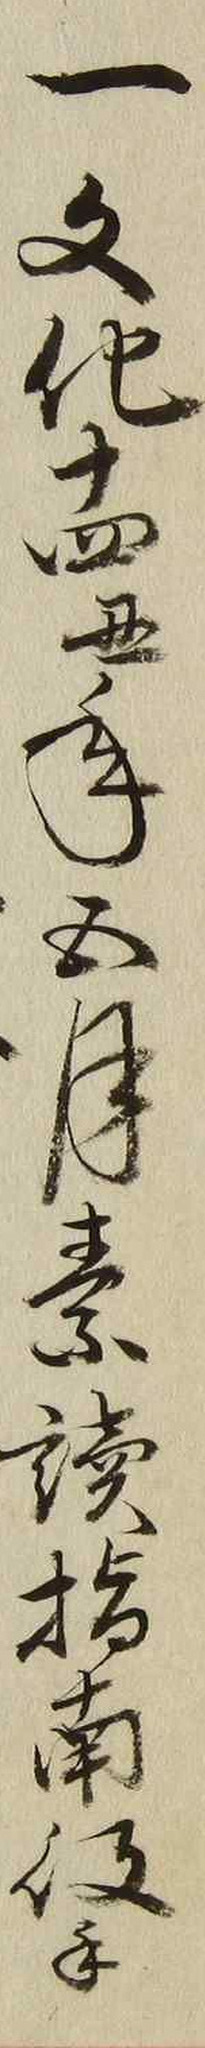一文化十四丑年五月素読指南役手
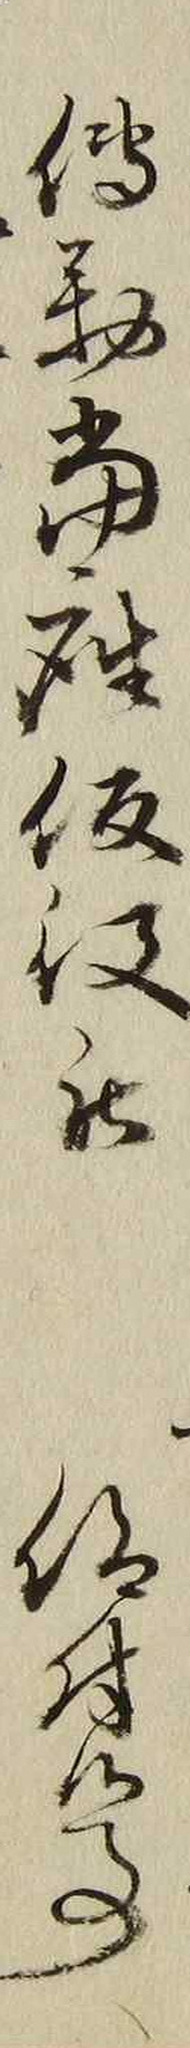伝勤万当座仮役被仰付候事
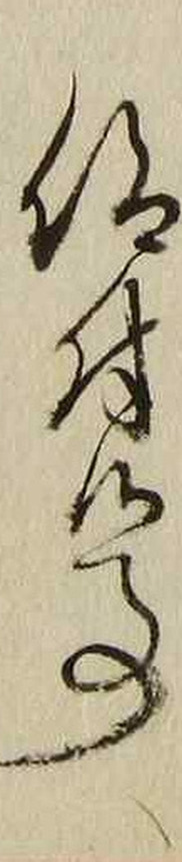仰付候事
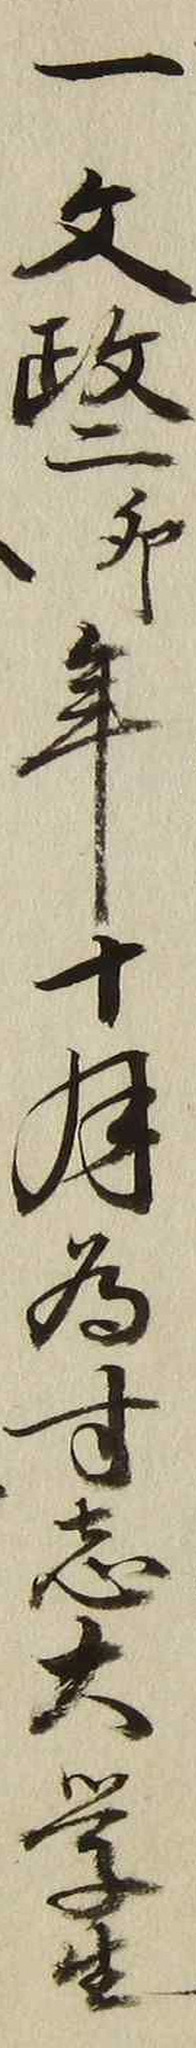一文政二卯年十月為寸志大学生
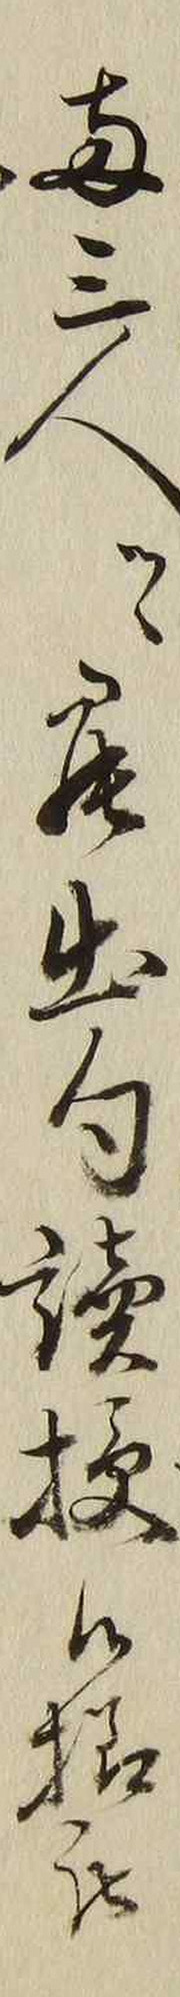両三人ツヽ罷出句読授候様被
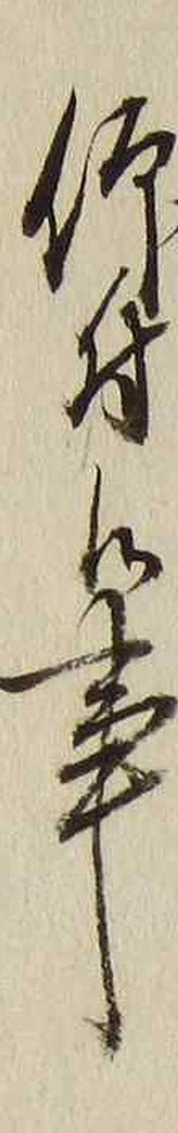仰付候事

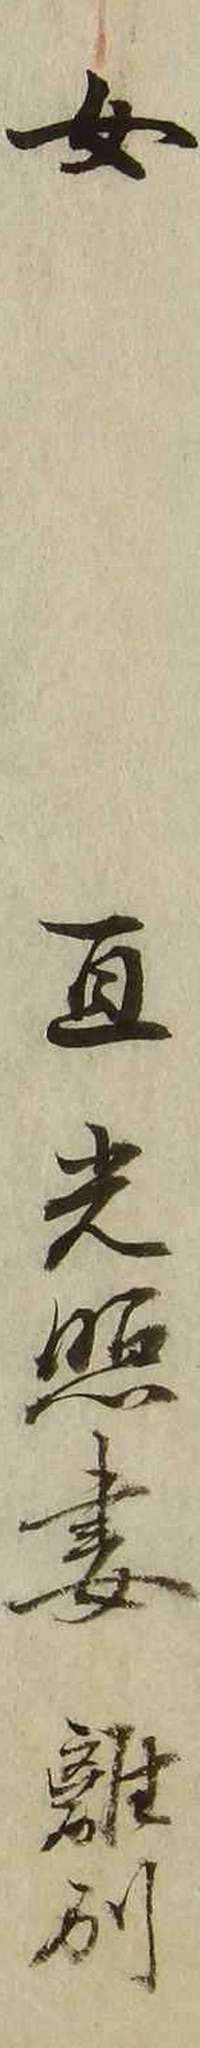女亘光照妻離別
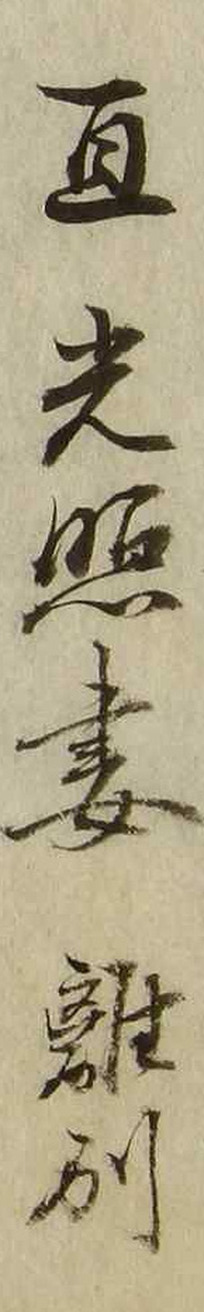女亘光照妻離別
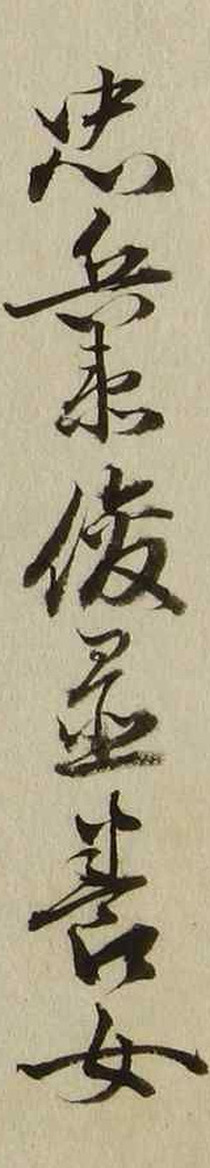忠兵衛俊置養女
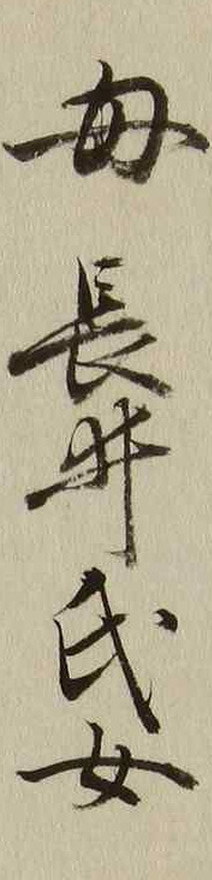母長井氏女
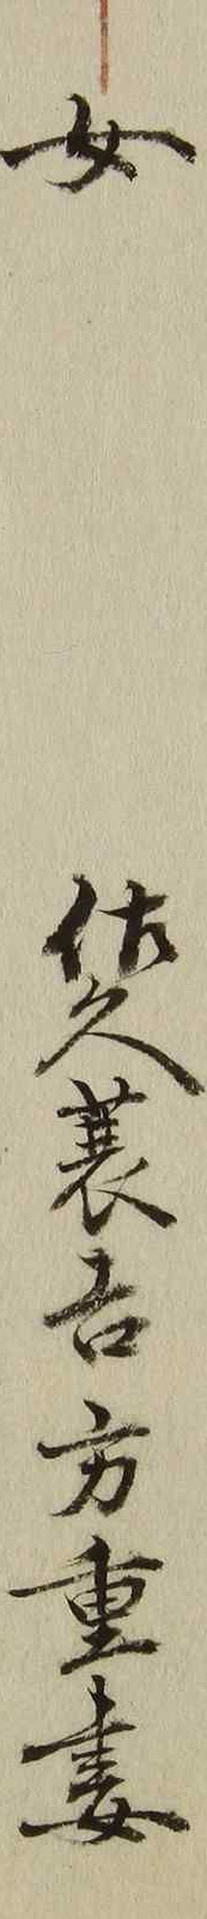女佐久簑吉方重妻
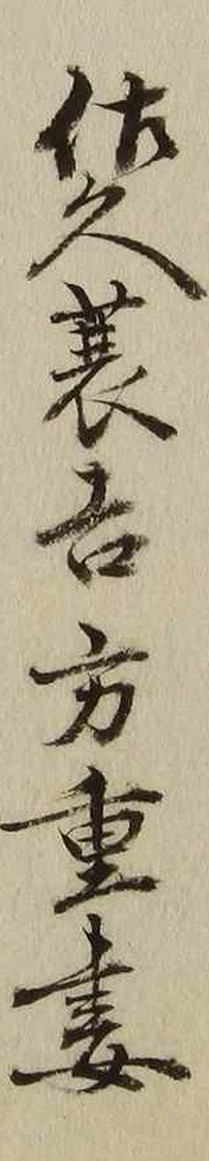女佐久簑吉方重妻
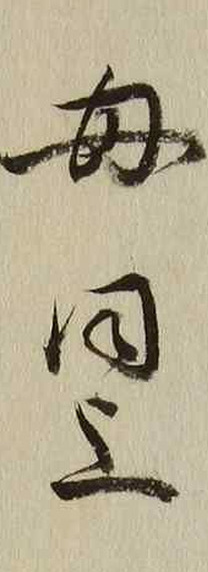母同上
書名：諸士系譜　巻之36　は之部4
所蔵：会津若松市立会津図書館
